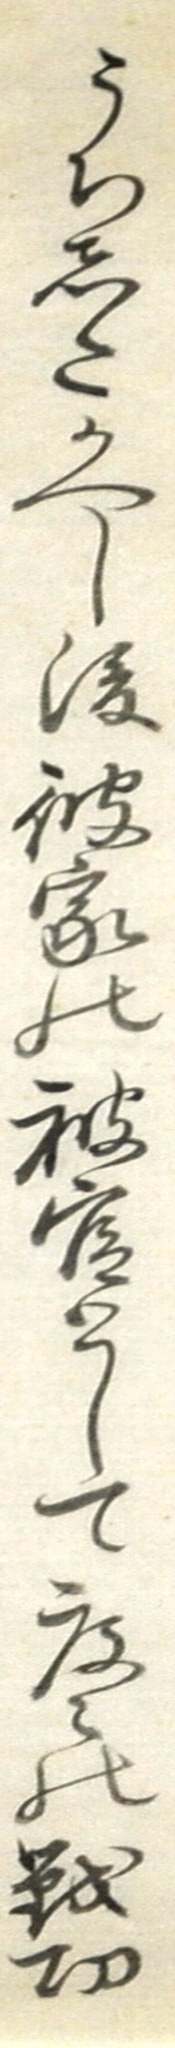うちしたかへし後彼家の被官として度々の戦功
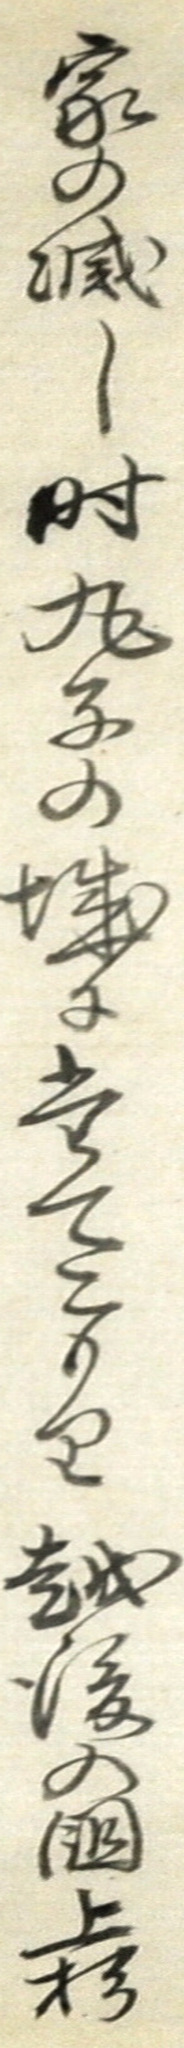家の滅し時丸子の城にたてこもり越後の国上杉
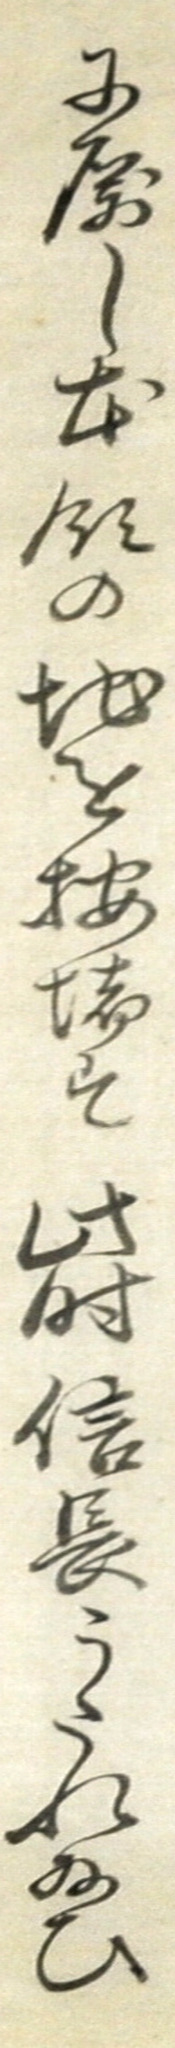に属し本領の地を按堵す此時信長うたれ給ひ
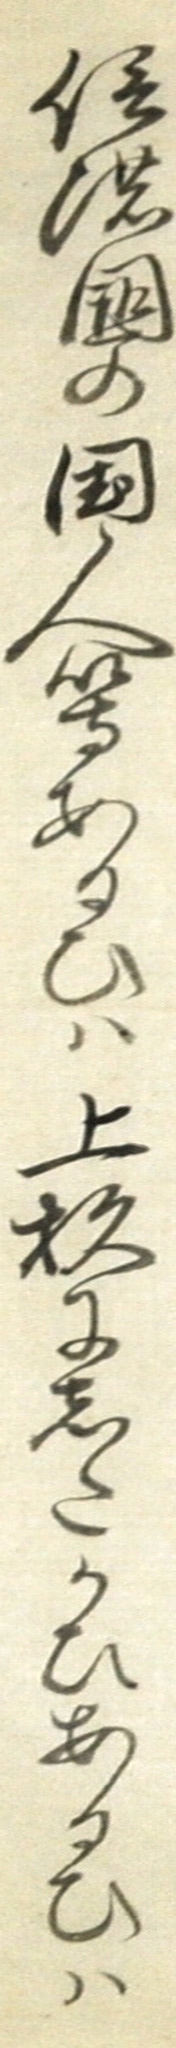信濃国の国人等あるひは上杉にしたかひあるひは
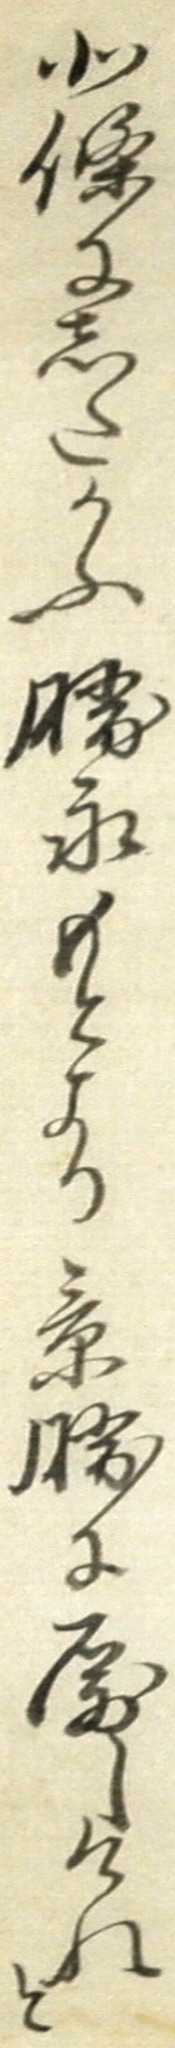北条にしたかふ勝永もとより景勝に属しけれど
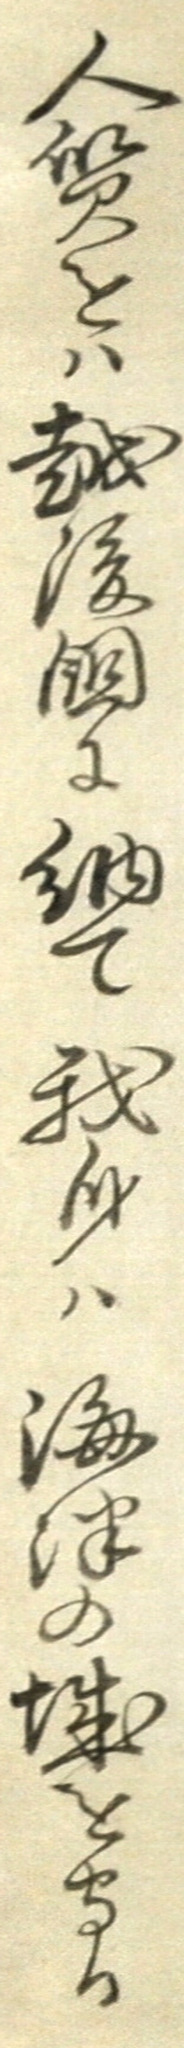人質をは越後国に納て我身は海津の城を守る

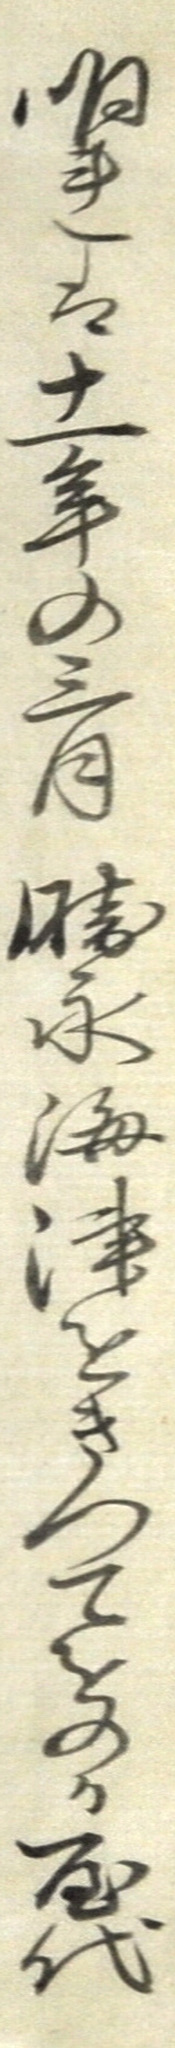明れは十一年の三月勝永海津をきつてをのか屋代
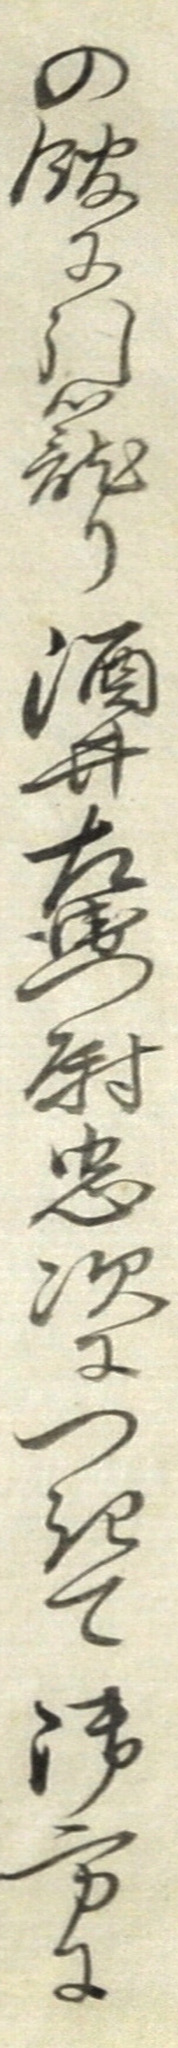の館に引籠り酒井左衛門尉忠次につきて御方に
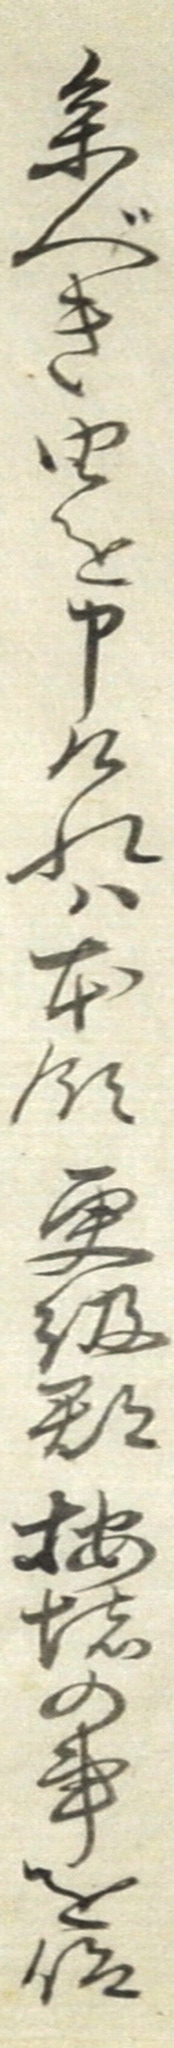参べき由を申けれは本領更級郡按堵の事を仰
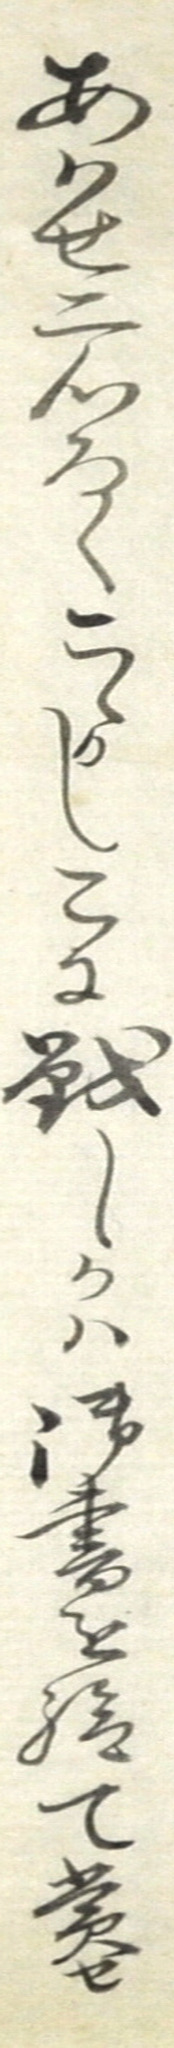あはせ二心なくこゝかしこに戦しかは御書を給て賞せ
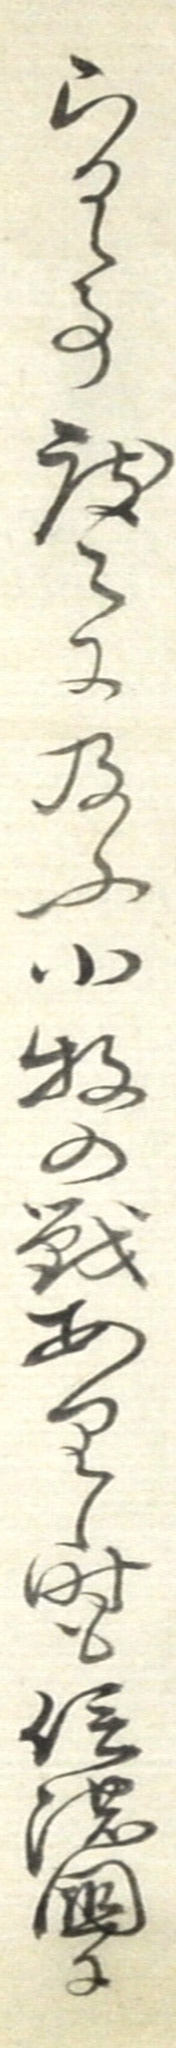らるゝ事度々に及ふ小牧の戦ありし時も信濃国に
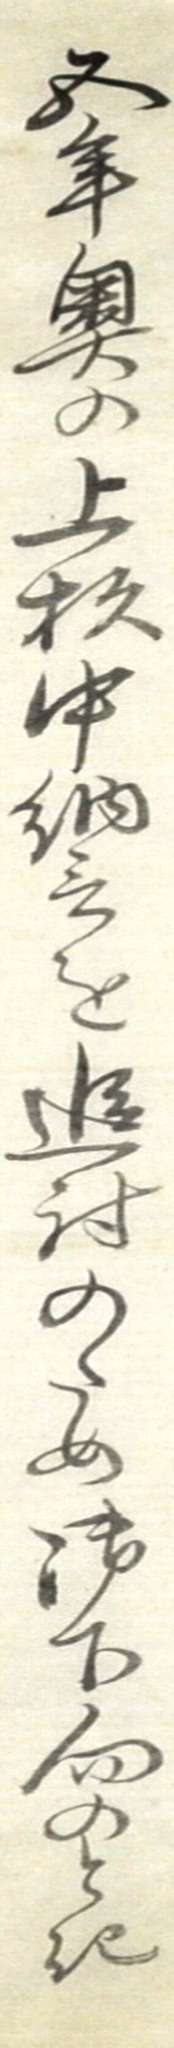五年奥の上杉中納言を追討のため御下向のとき
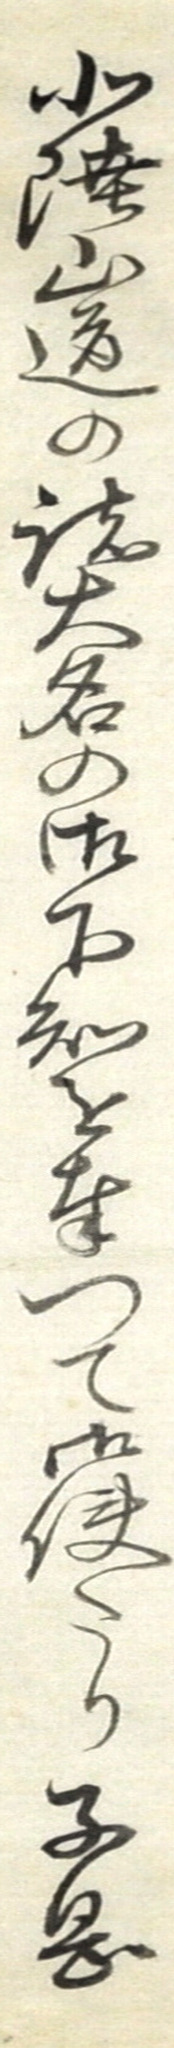北陸山道の諸大名の御下知を奉つて御使たり子息
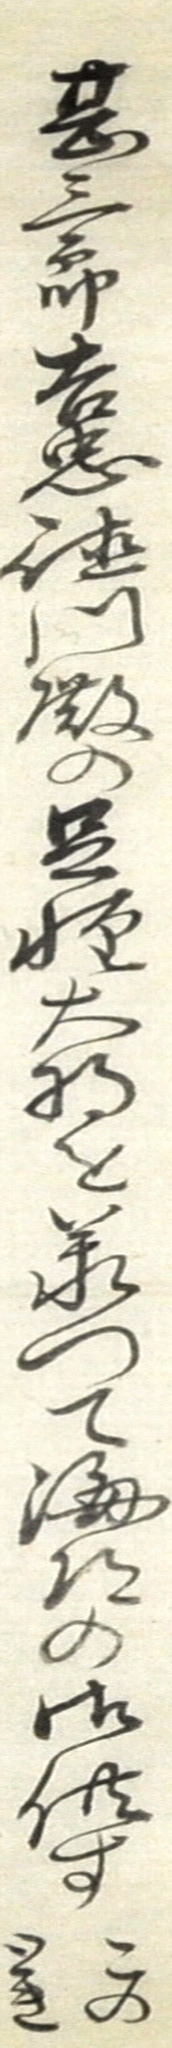甚三郎吉忠徳川殿の足軽大将を承つて海道の御供すこのとき
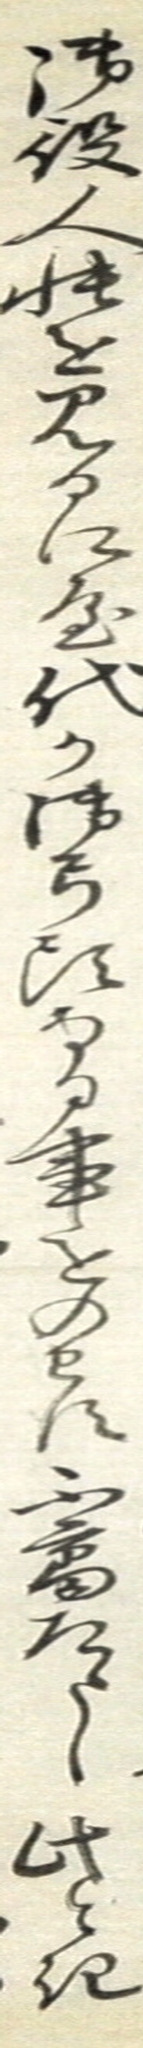御役人帳を見るに屋代か御弓頭なる事をのせす不審たゝし此とき
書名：藩翰譜（六）
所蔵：伊那市立高遠町図書館・合同会社AMANE
